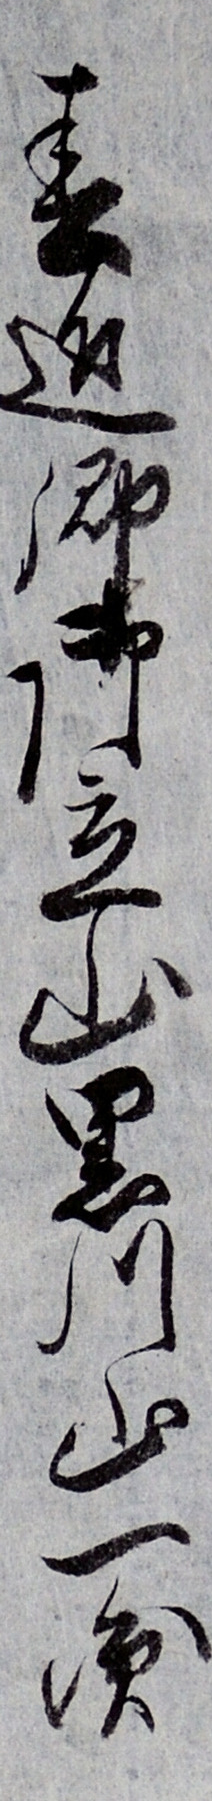春近郷御立山黒川山一円
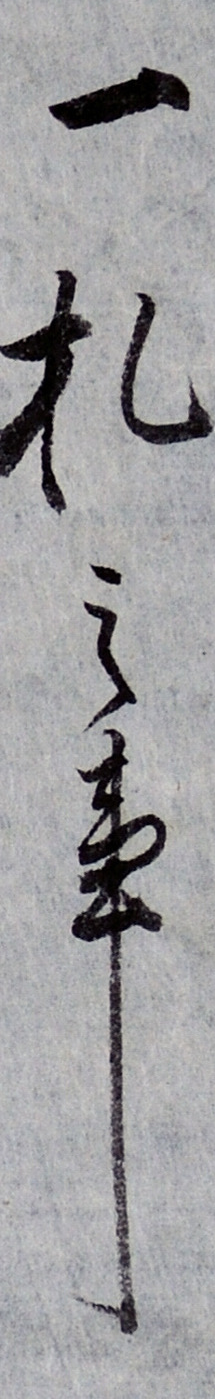一札之事
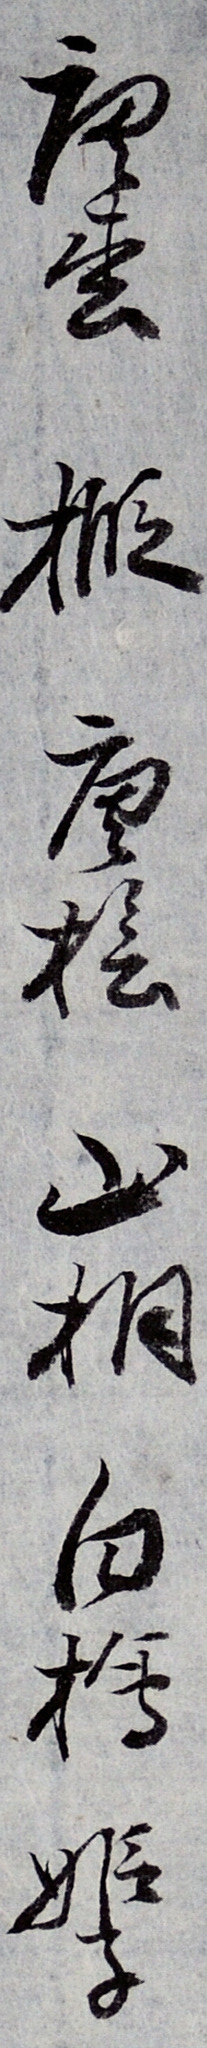唐松樅唐檜山桐城檜姫子
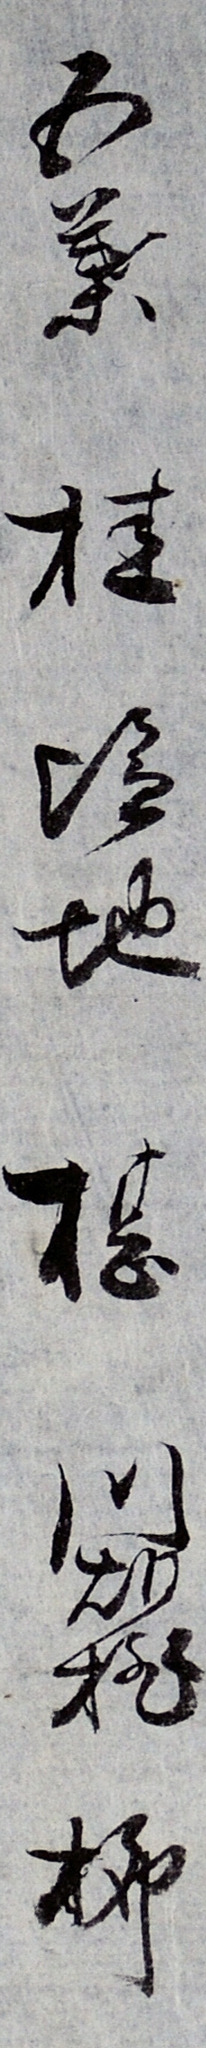五葉桂塩地椹川胡桃柳
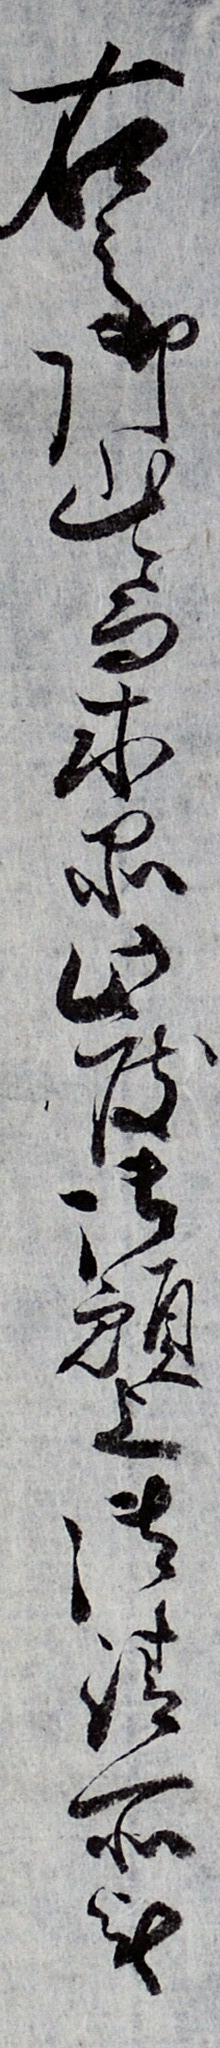右之御山ニ而木品此度御願上御請所被
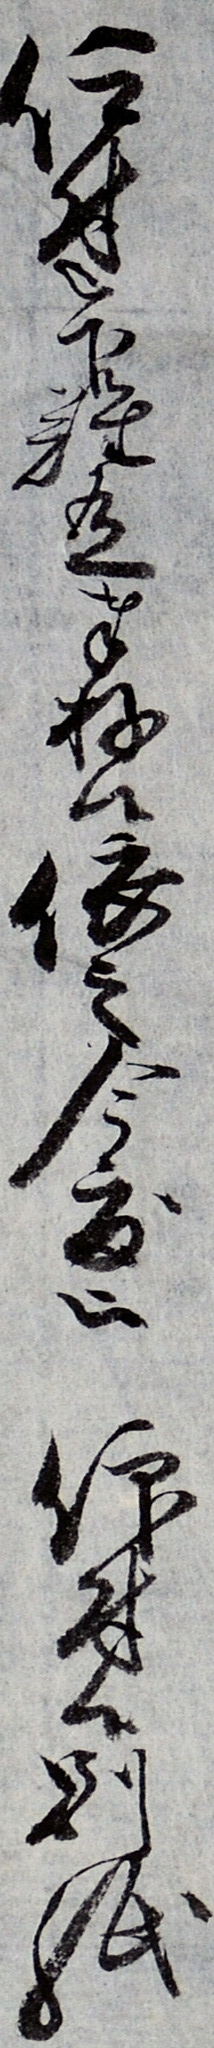仰付被下候難有奉存候依之今度被仰付候別紙
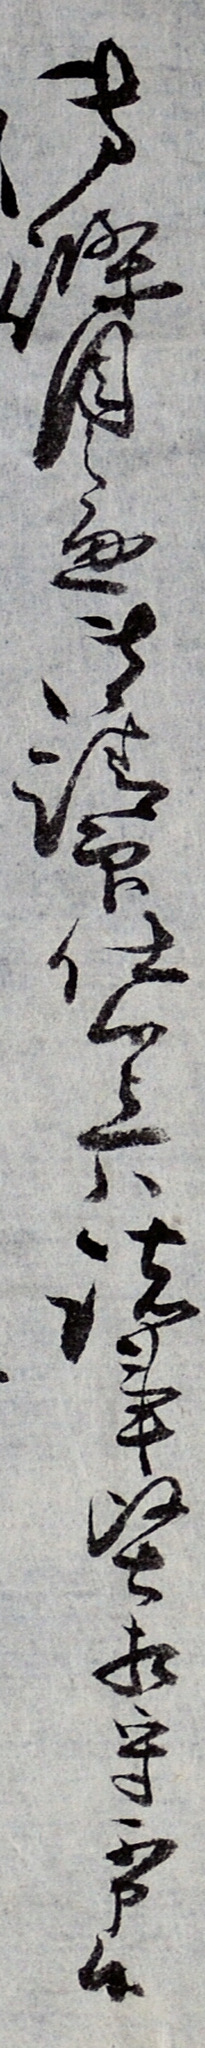御條目之通御請印仕候上ハ諸事堅相守可申候
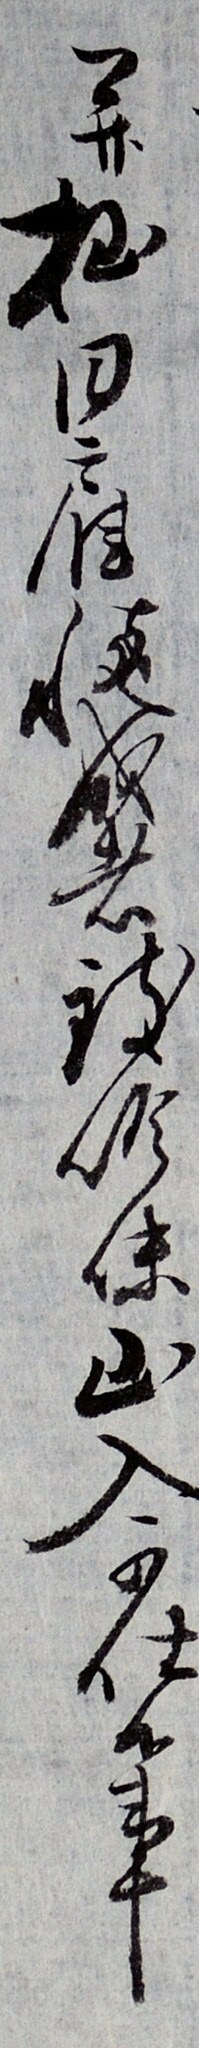幷杣日雇慥成者致吟味山入可仕候事
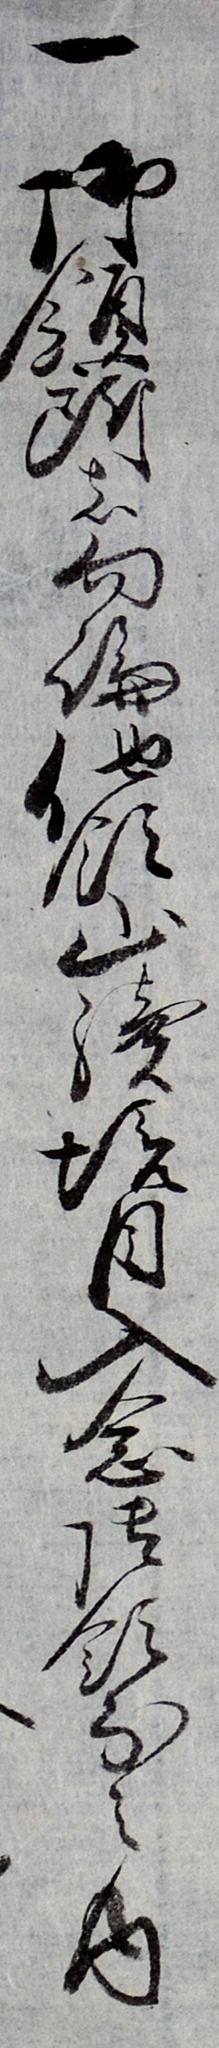一御領所者勿論他領山続境目入念御領分之内
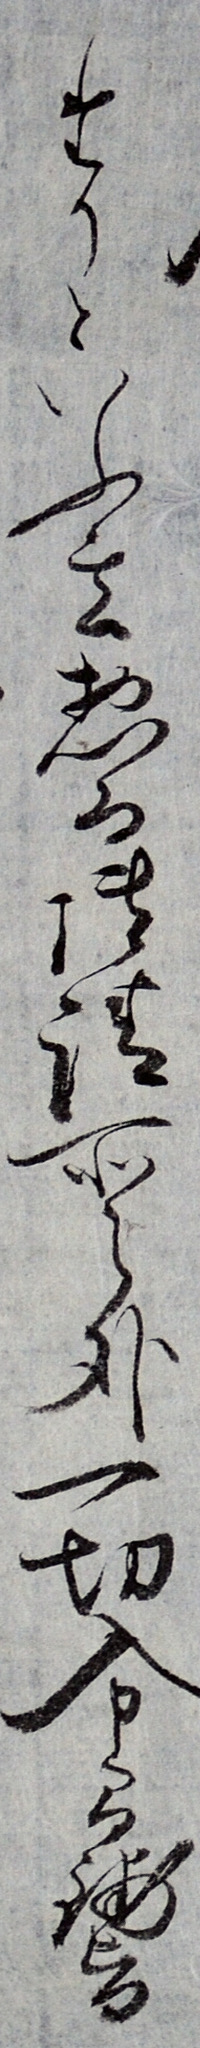たりといふ共惣而御請求所之外一切入申間鋪旨
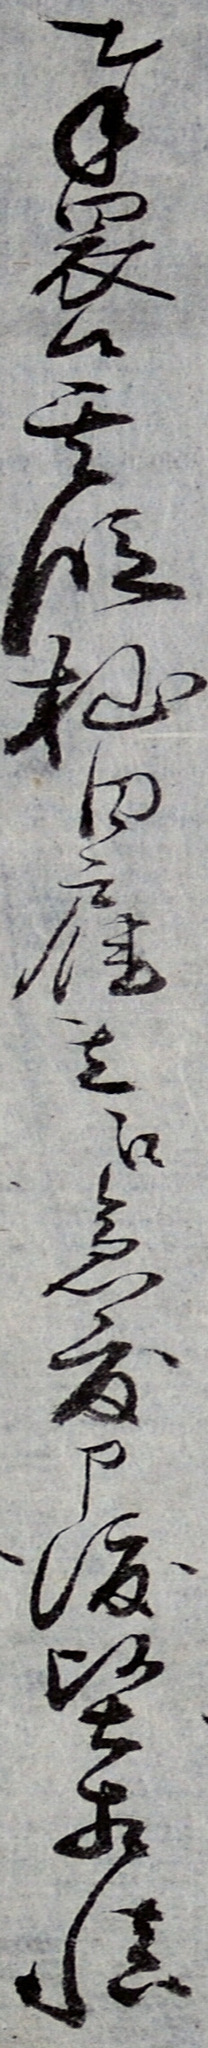奉畏候其段杣日雇共江急度申渡堅相慎
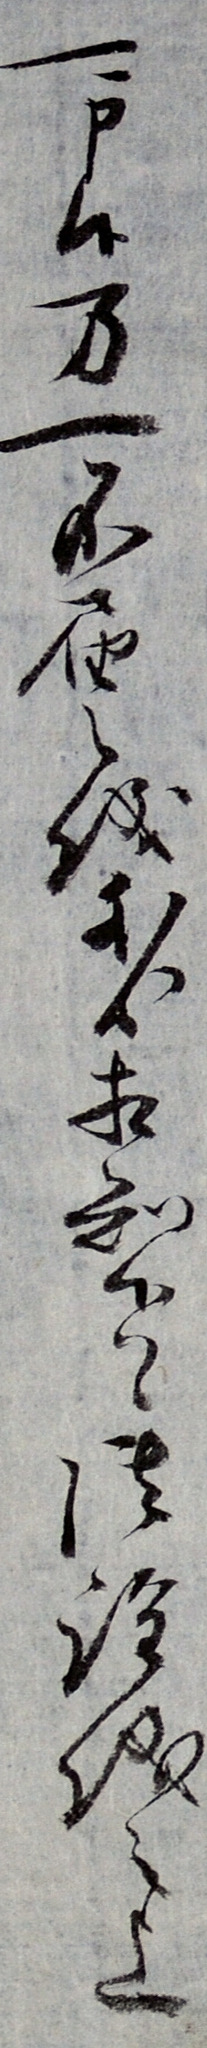可申候万一不届之儀外ゟ相知候ハゟハゝ御詮儀之上
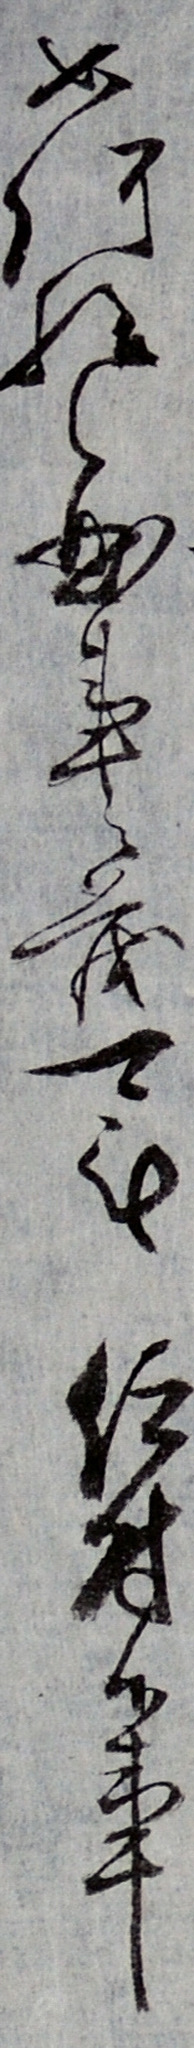如何様之曲事ニ茂可被仰付候事
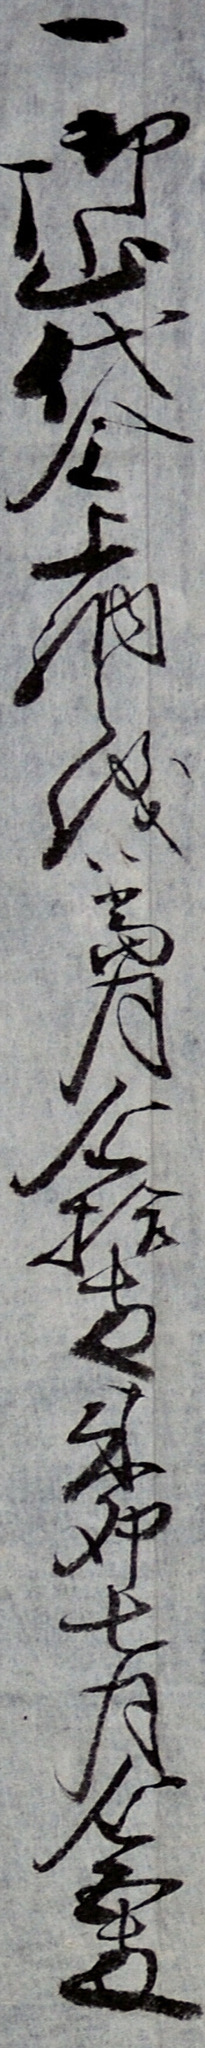一御山代金上納之儀ハ当月金拾両来卯七月金五両
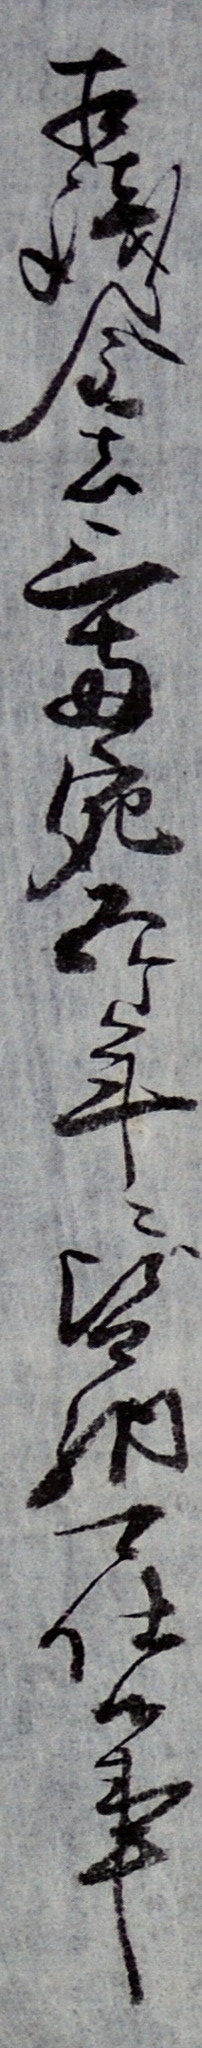相残金者三両宛五ケ年ニ皆納可仕候事
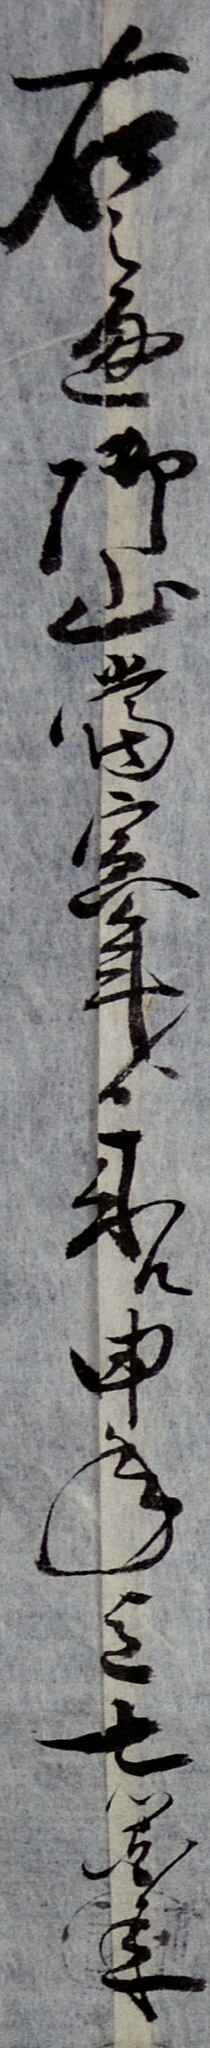右之通御山当寅年ゟ来ル申年迄七個所箇年
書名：一札之事
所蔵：伊那市立高遠町図書館・合同会社AMANE
